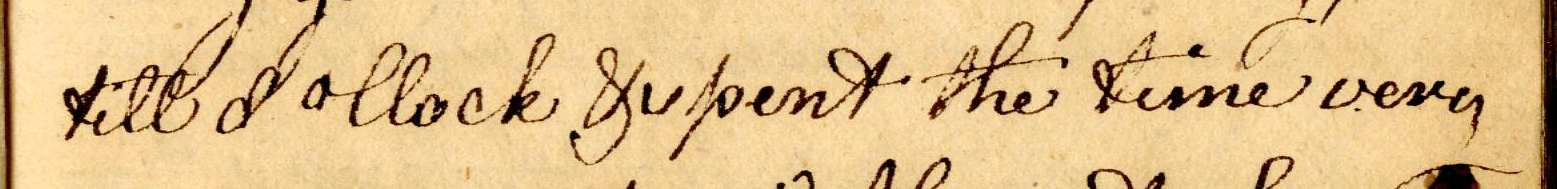till 8 ^o Clock & spent the time very
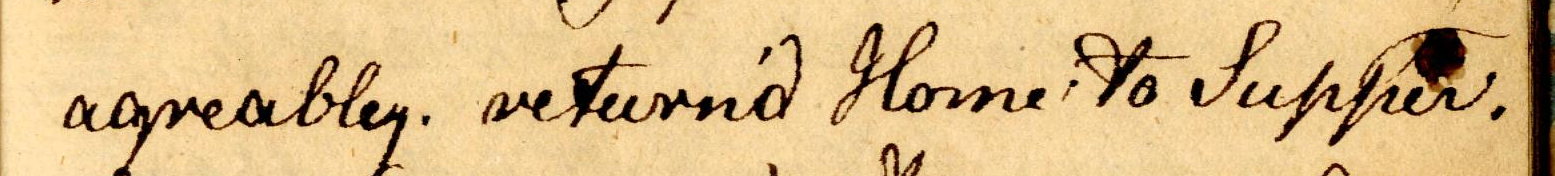agreably. return'd Home to Supper.
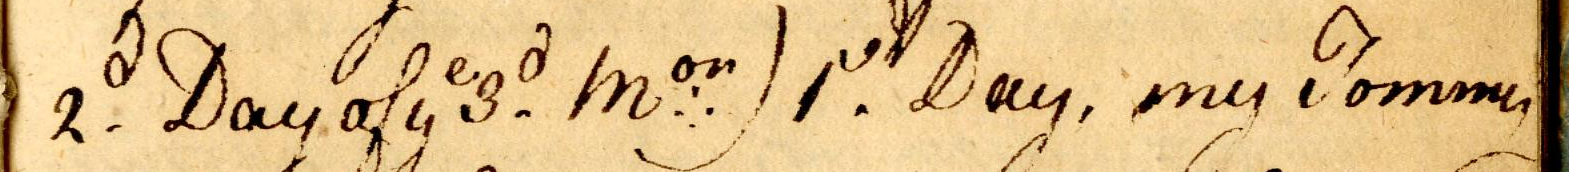2^d. Day of y^e 3^d. M^or ) 1^st Day, my Tommy
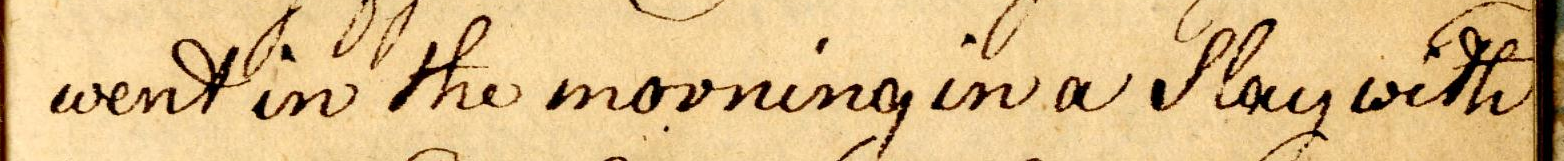went in the morning in a Slay with
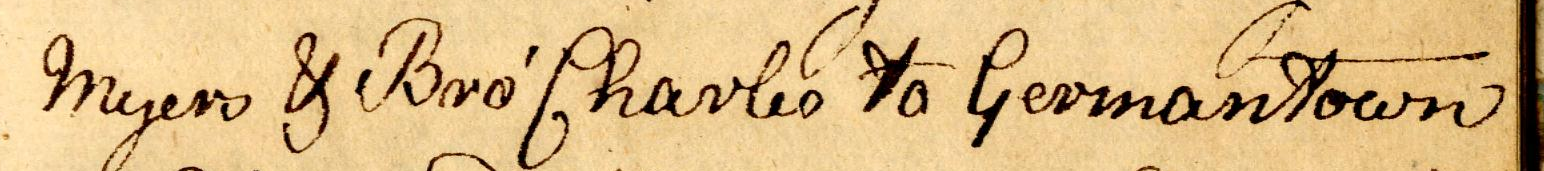Myers & Bro' Charles to Germantown
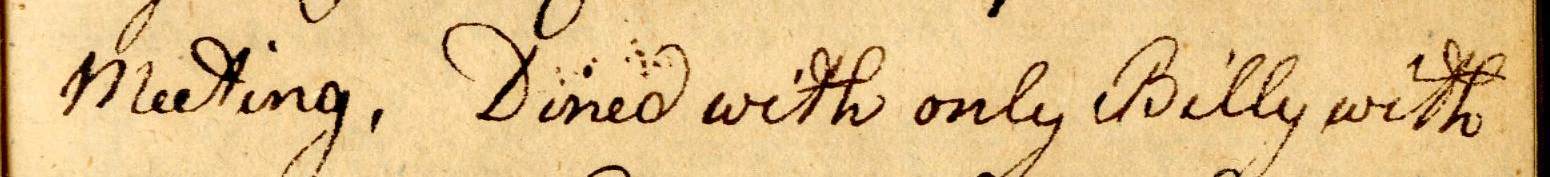Meeting, Dined with only Billy with
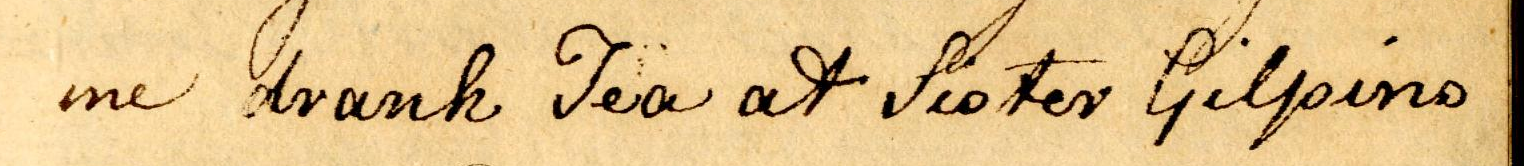me drank Tea at Sister Gilpins
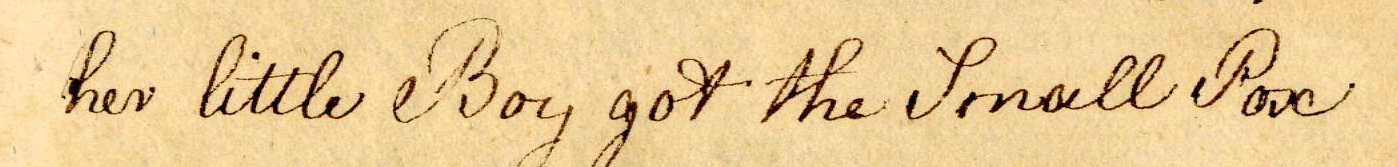her little Boy got the Small Pox
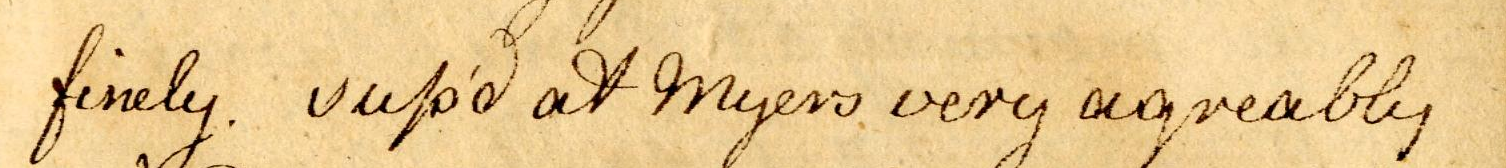finely. sup'd at Myers very agreably
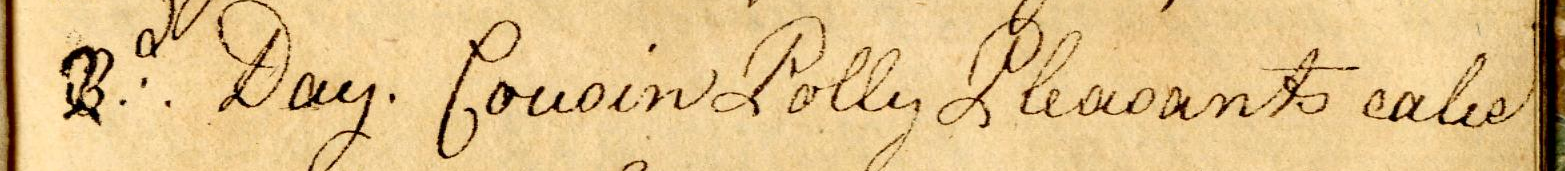3^d Day. Cousin Polly Pleasants caled
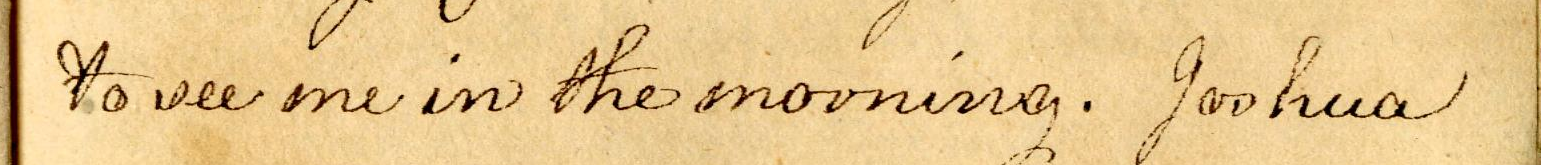to see me in the morning. Joshua
